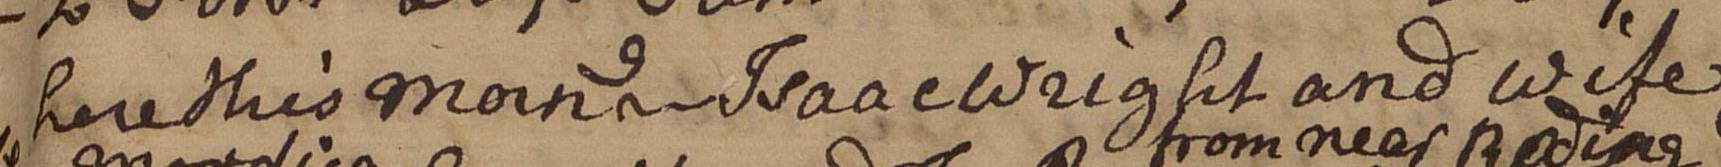here this morn^g- Isaac Wright and wife,
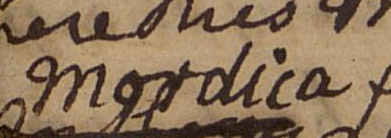Mordica
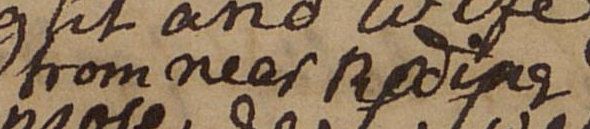from near Reding
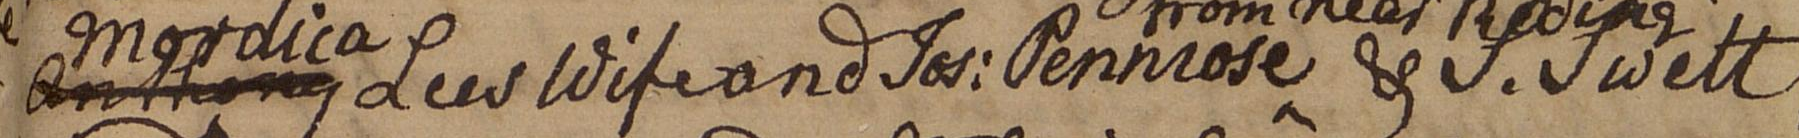[Anthony] Lees Wife and Jos: Pennrose ^ & S. Swett,
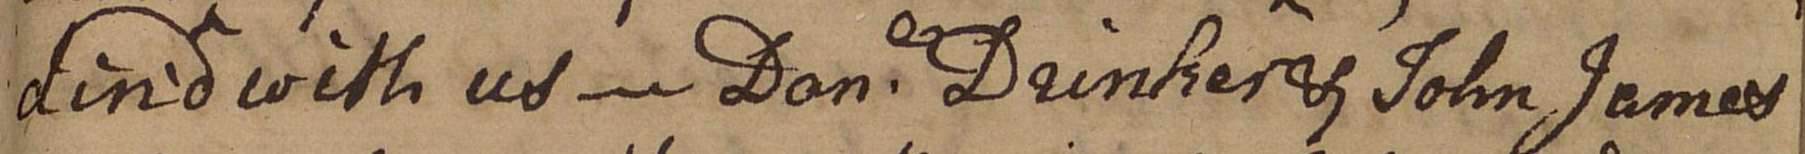din'd with us- Dan^l. Drinker & John James
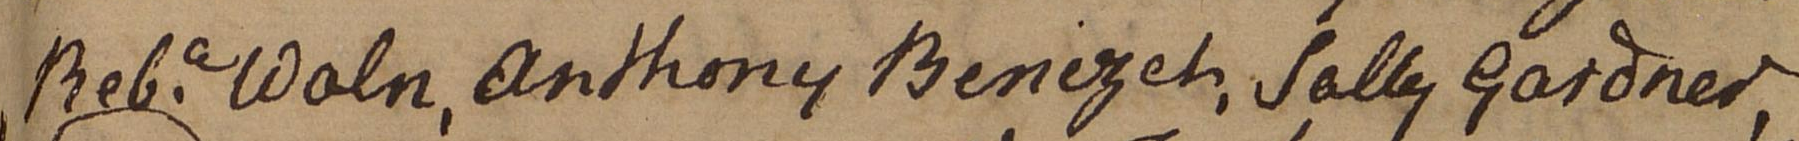Reb^a. Waln, Anthony Benezet, Sally Gardner,
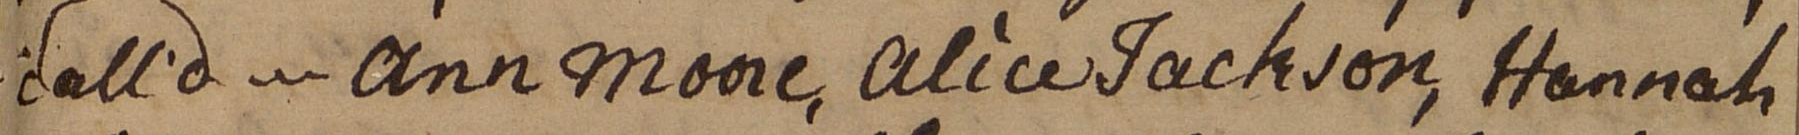call'd - Ann Moore, Alice Jackson, Hannah
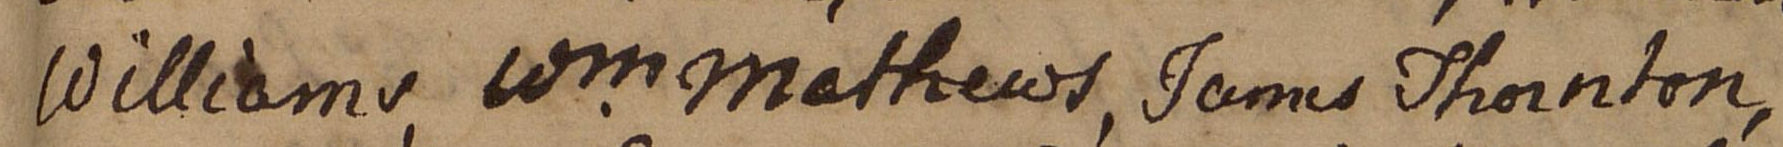Williams, W^m. Mathews, James Thornton,
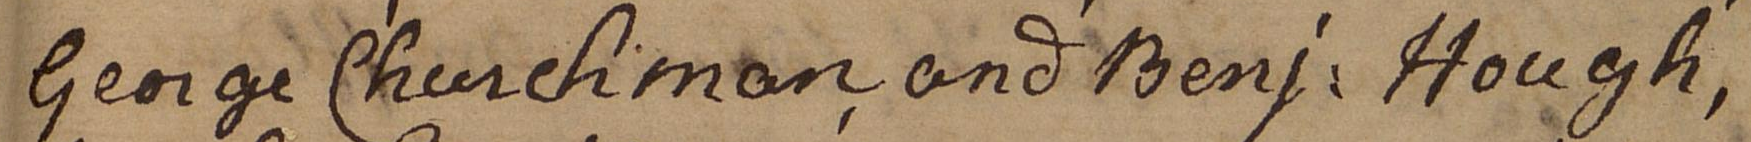George Churchman and Benj. Hough,
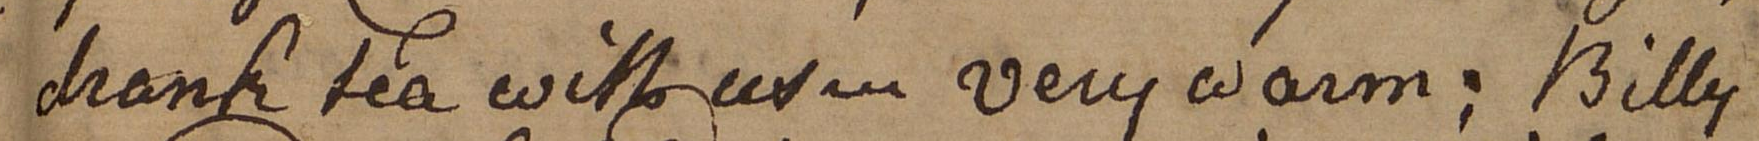drank tea with us- very warm; Billy
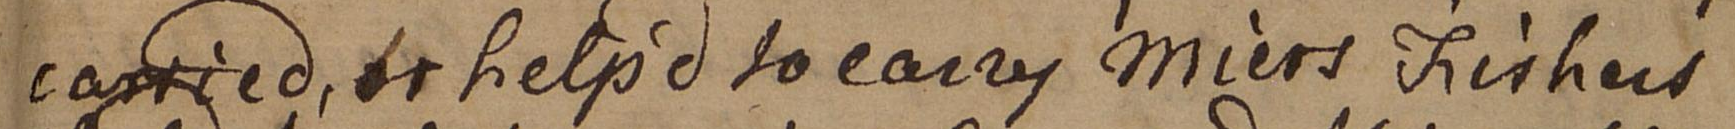carried, or help'd to carry Miers Fishers
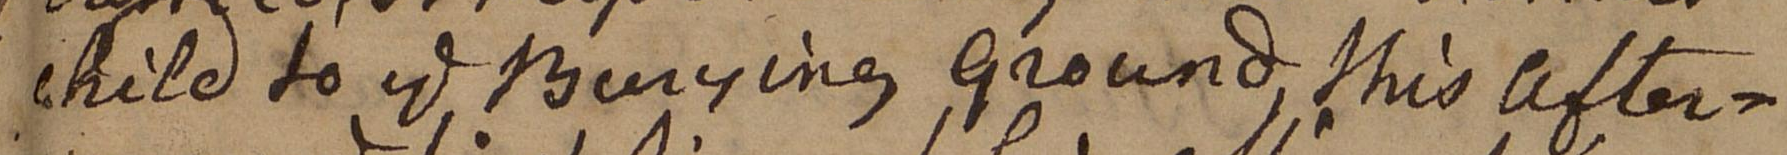child to y^e Burying Ground, this after-
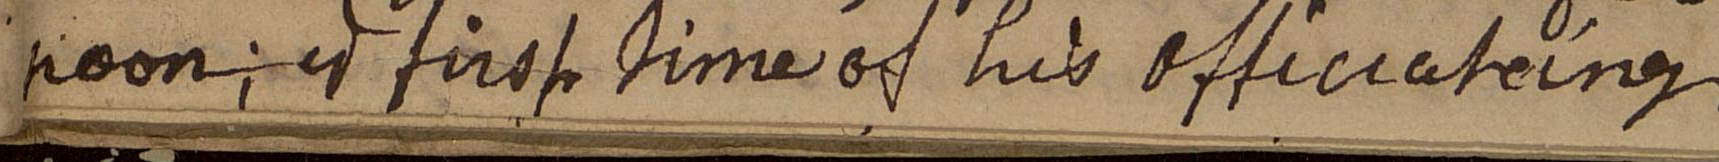noon; y^e first time of his officiateing
